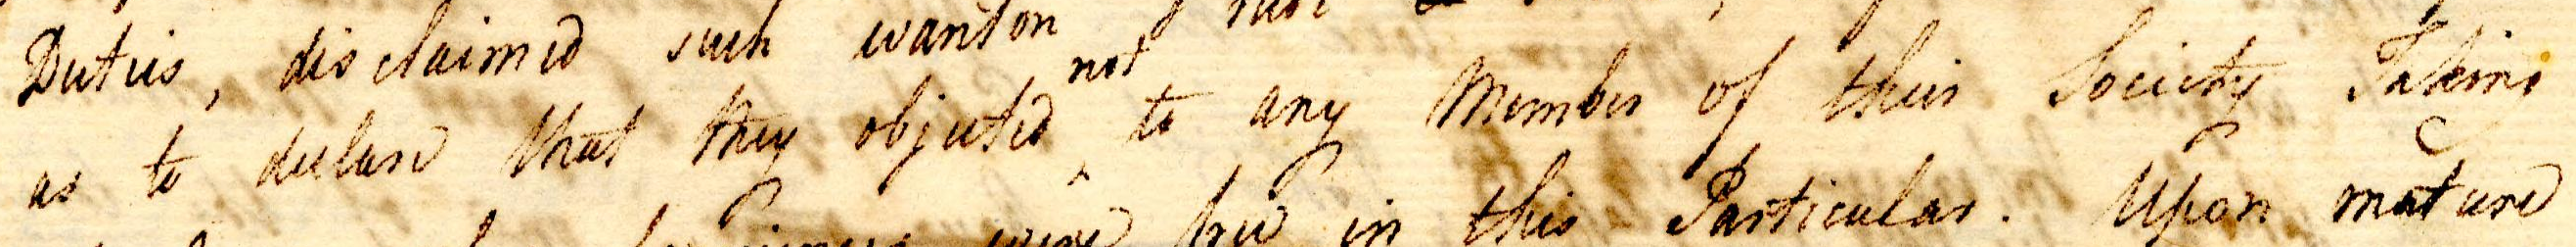as to declare that they objected to any Member of their Society Taking
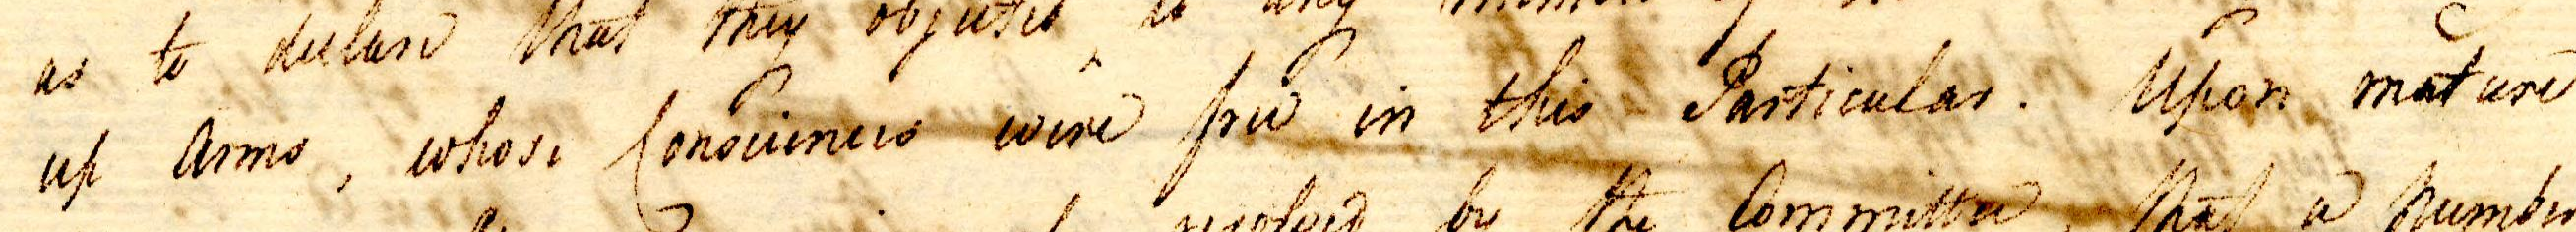up ams, whose Consciences were free in this Particular. Upon mature
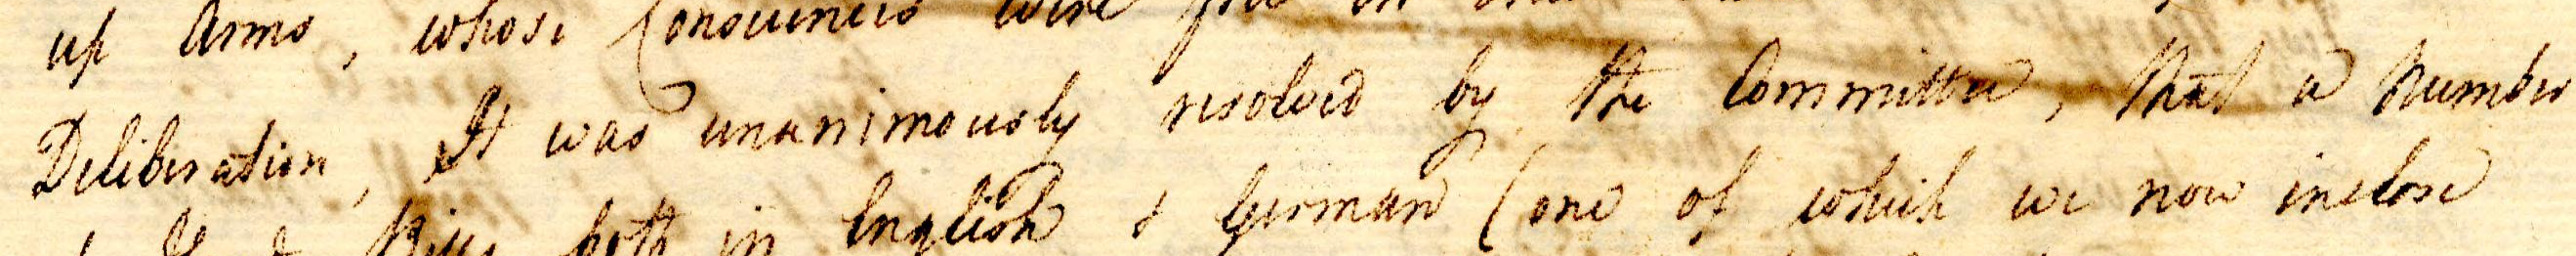Deiliberation, It was unanimously resolved by the Commitee that a number
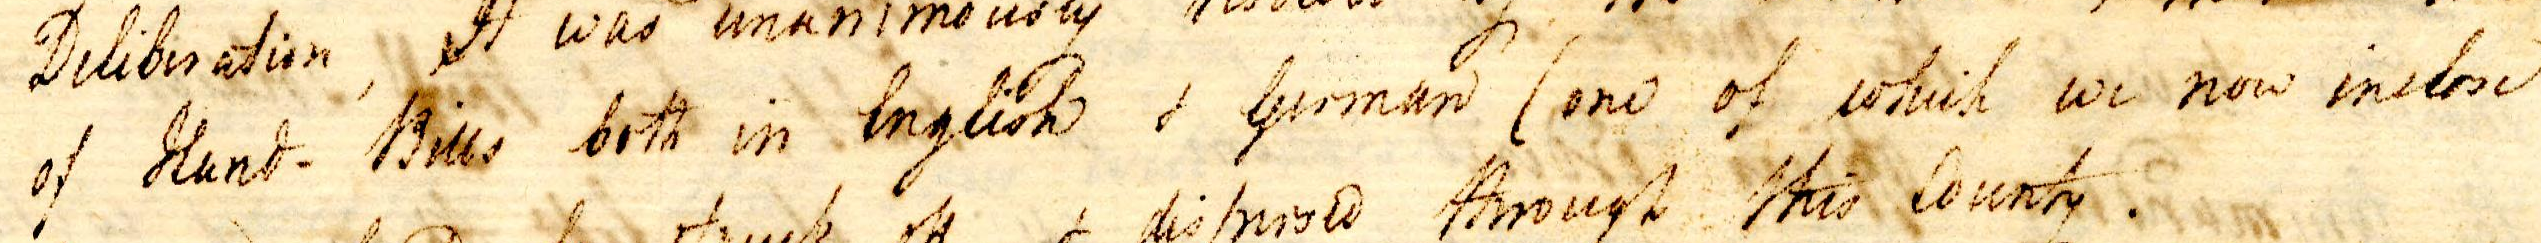of Hand Bills both in English & German (one of which we now inclose
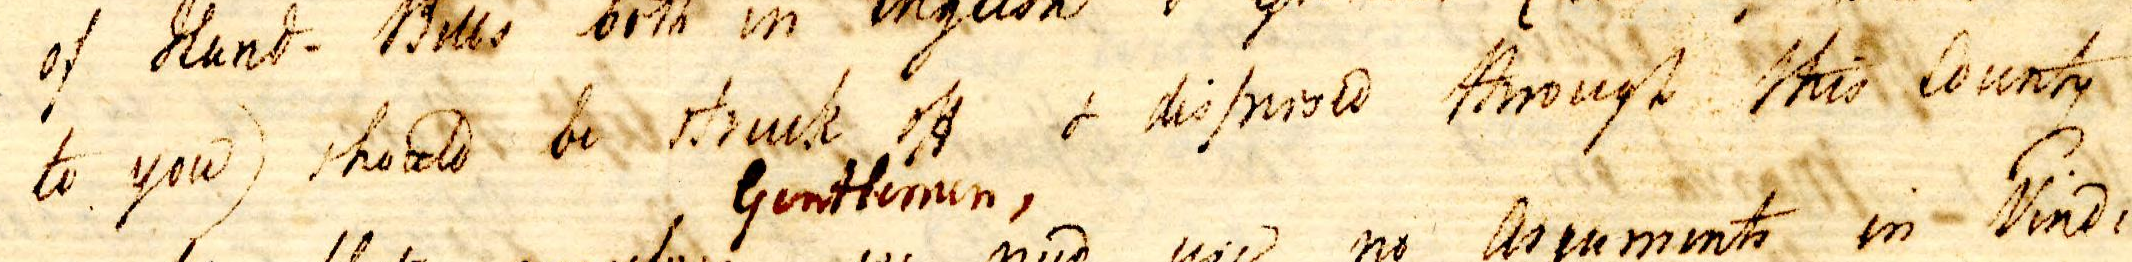to you) should be struck off & dispersed through this county.
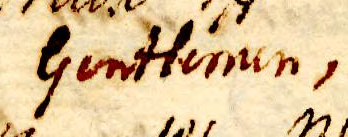Gentlemen,
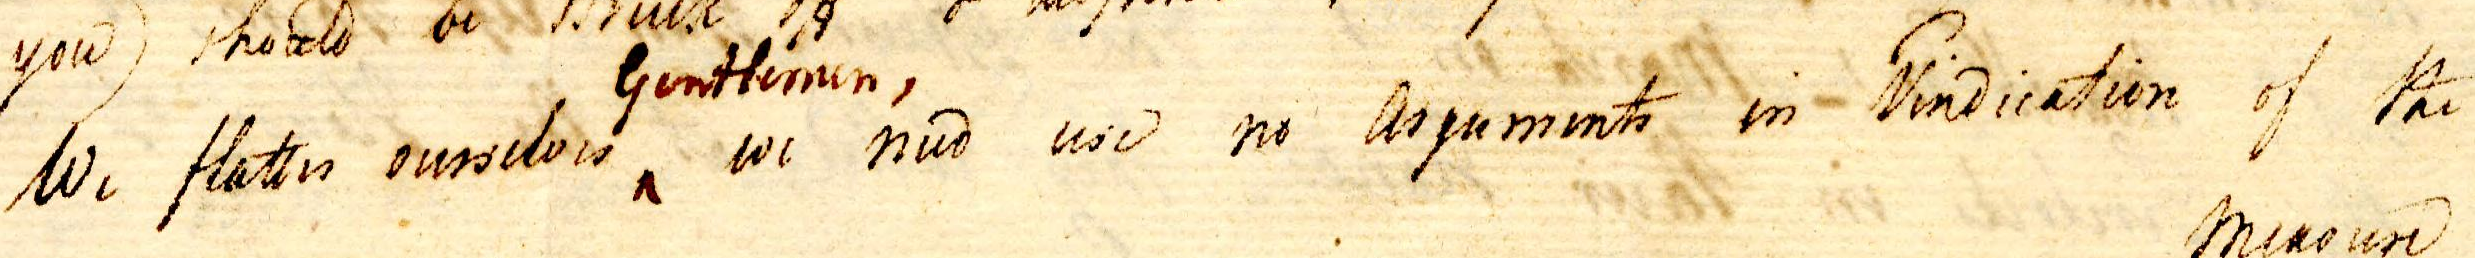We flatter ourselves ^ we need use no Arguments in Vindication of the
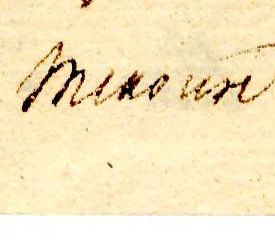Measure
